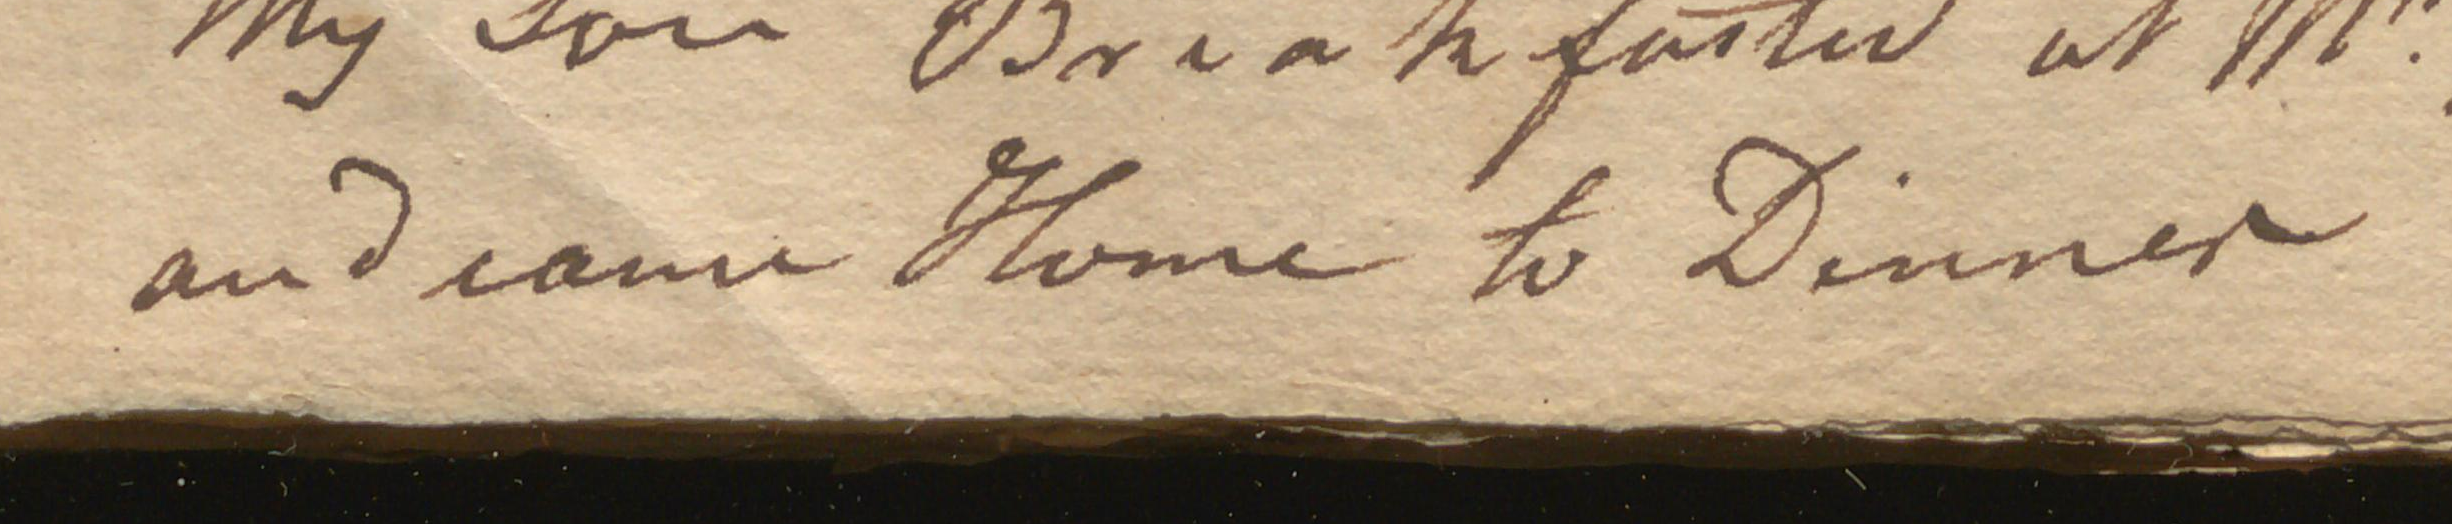and came Home to Dinner
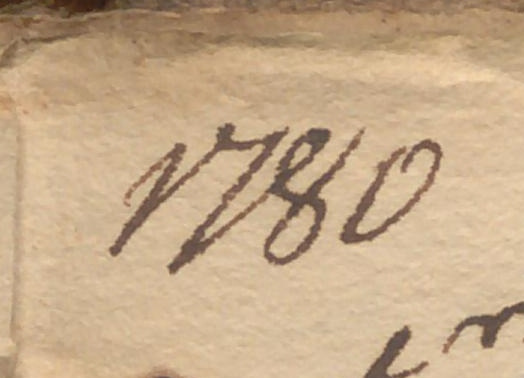1780
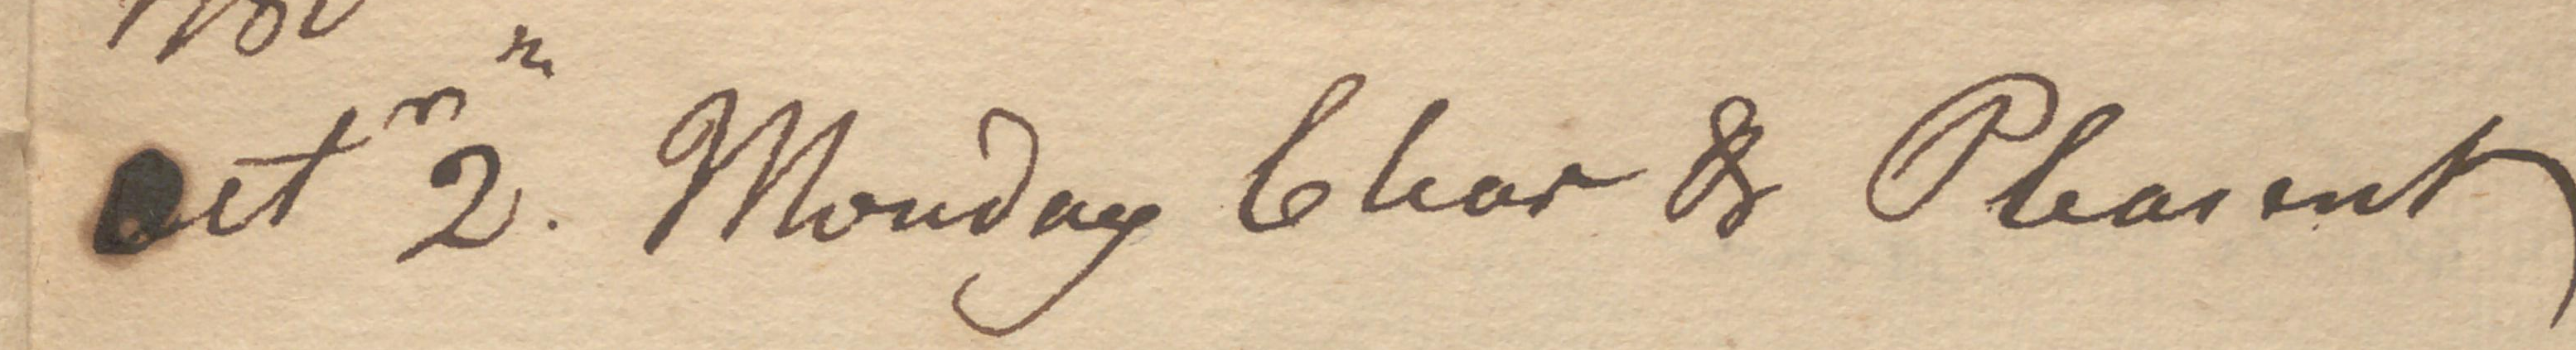Oct^r 2^th. Monday Clear & Pleasent
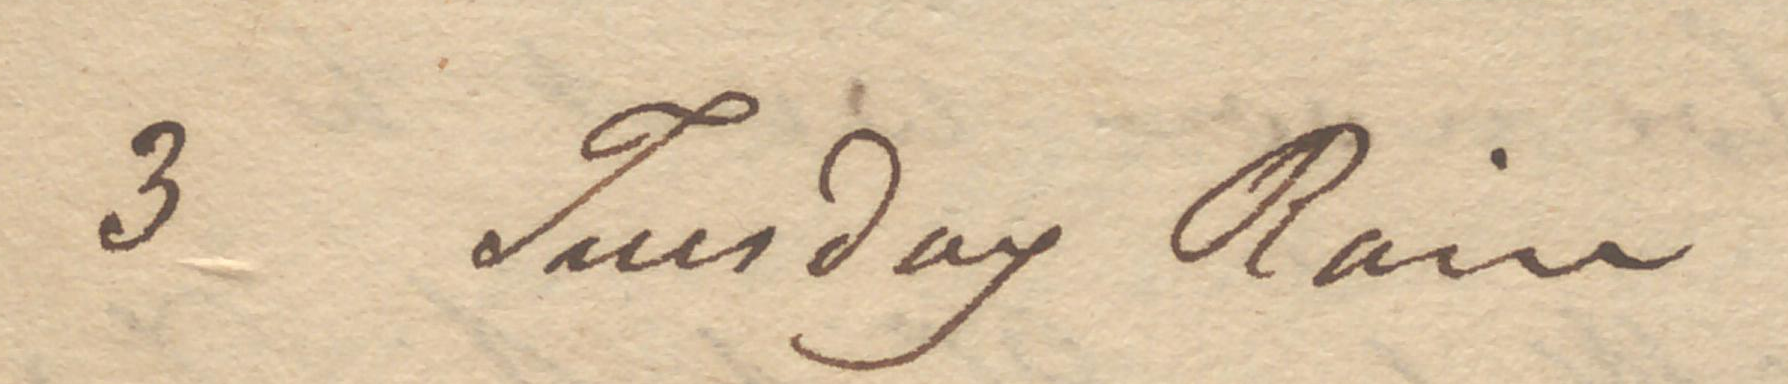3 Tuesday Rain
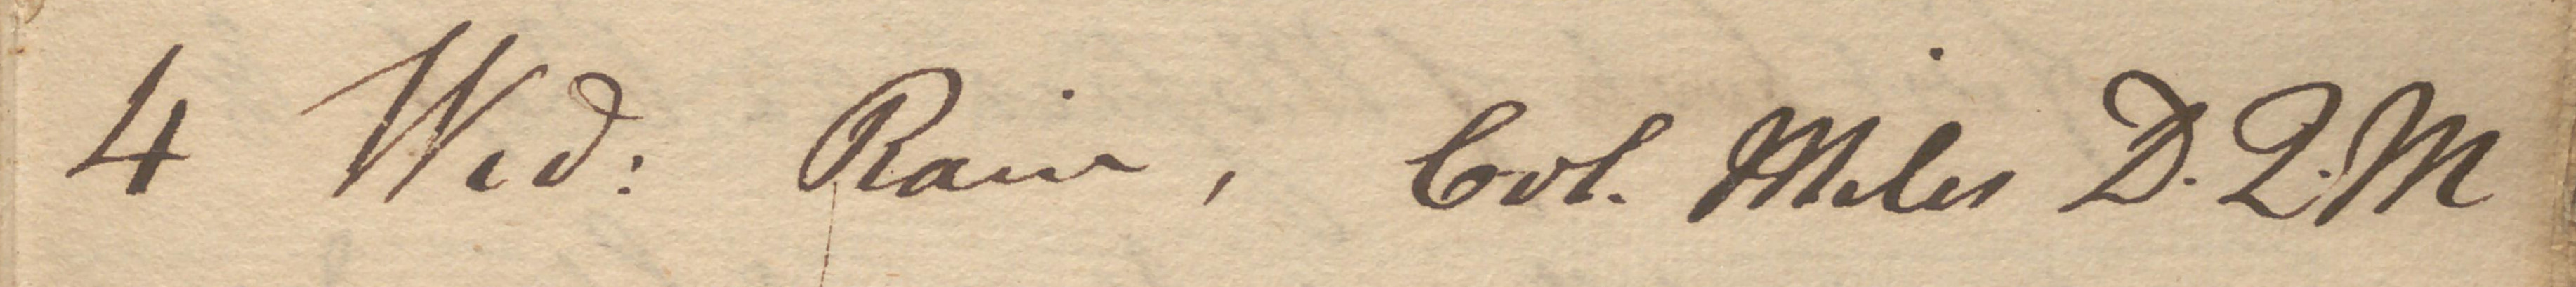4 Wed. Rain, Col. Miles D.Q.M
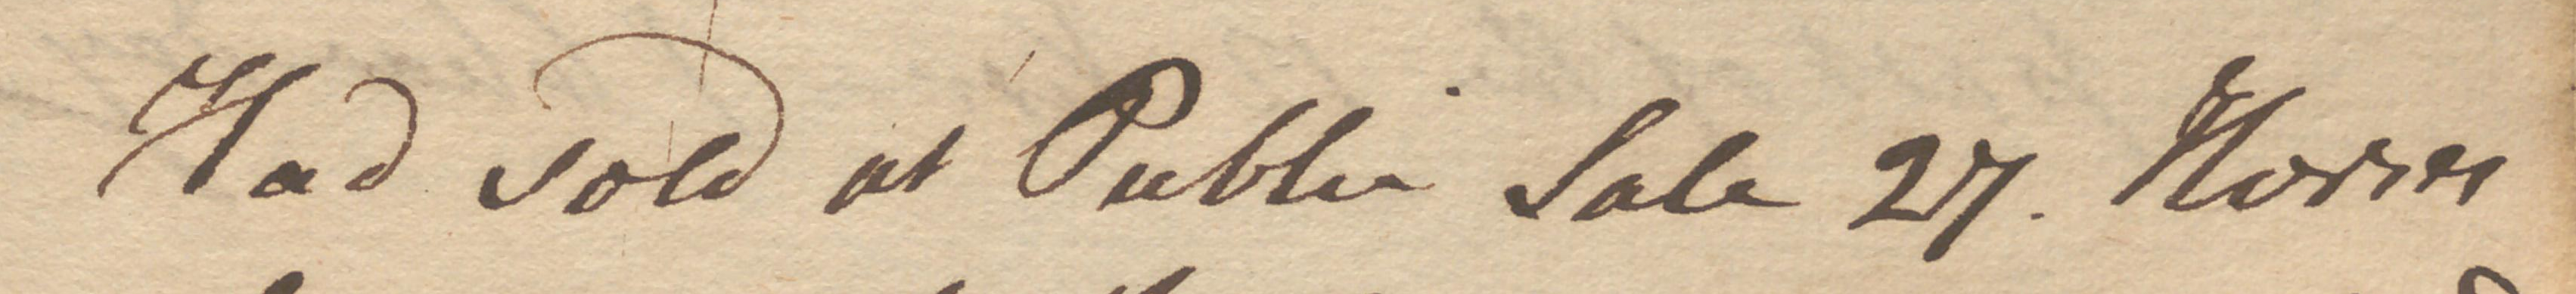Had sold at Public Sale 27 Horses
